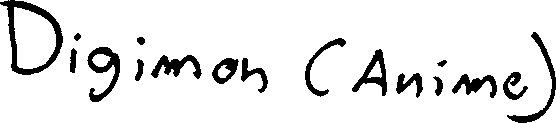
Digimon (Anime)
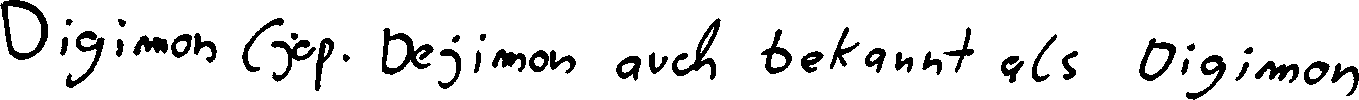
Digimon (jap. Dejimon auch bekannt als Digimon
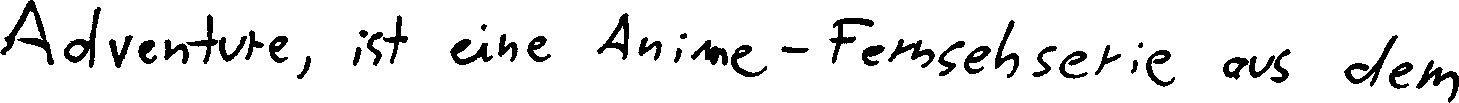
Adventure, ist eine Anime-Fernsehserie aus dem
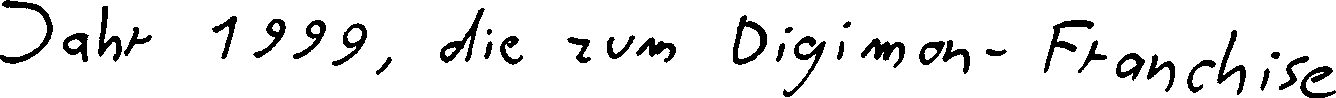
Jahr 1999, die zum Digimon-Franchise
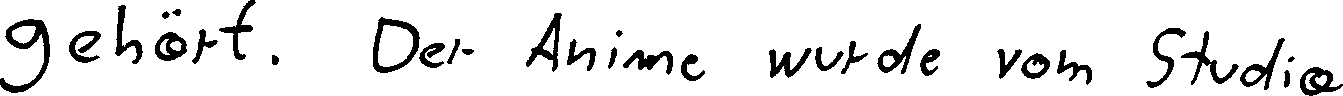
gehört. Der Anime wurde vom Studio
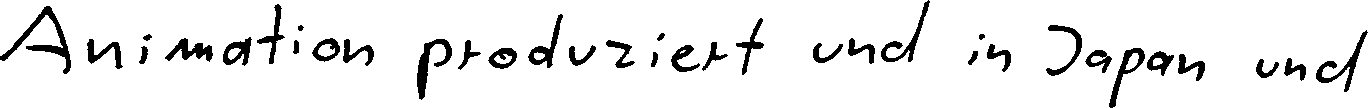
Animation produziert und in Japan und
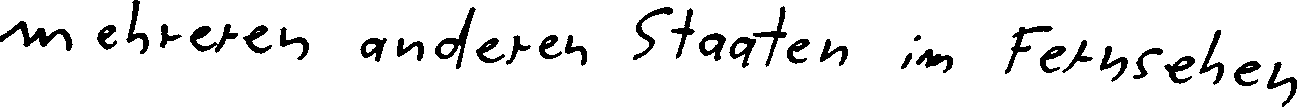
mehreren anderen Staaten im Fernsehen
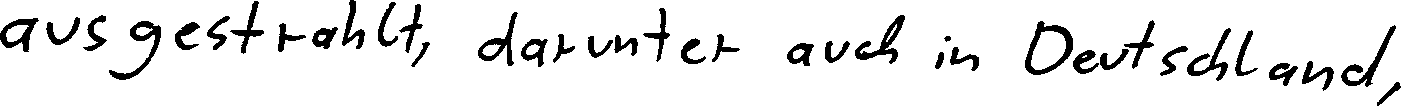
ausgestrahlt, darunter auch in Deutschland,
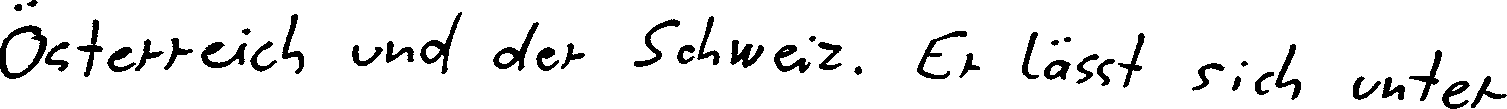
Österreich und der Schweiz. Er lässt sich unter
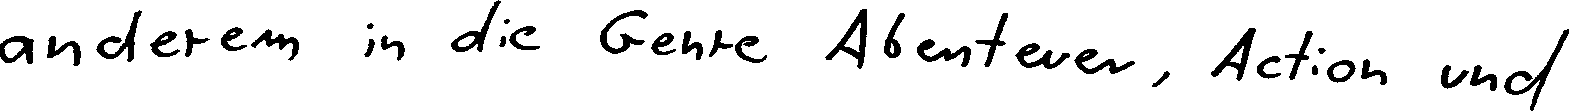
anderem in die Genre Abenteuer, Action und
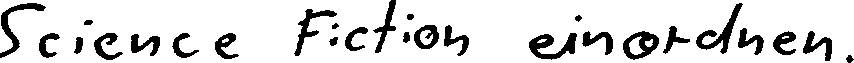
Science Fiction einordnen.
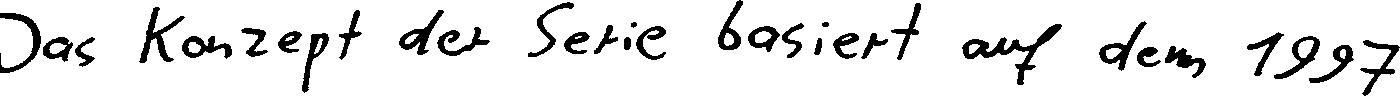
Das Konzept der Serie basiert auf dem 1997
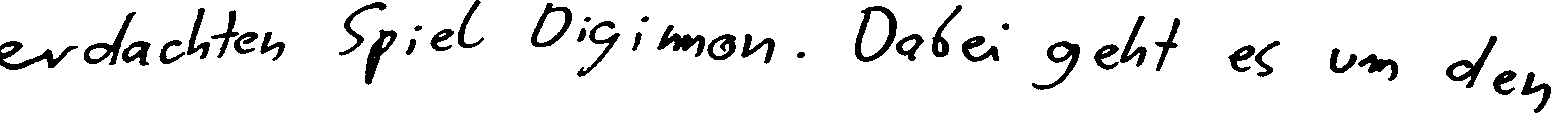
erdachten Spiel Digimon. Dabei geht es um den
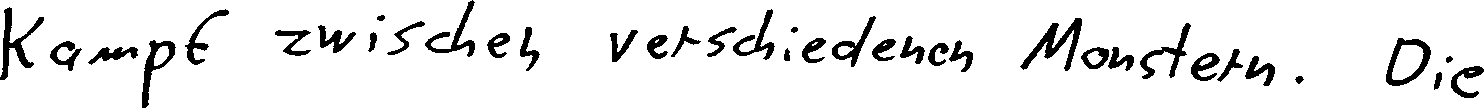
Kampf zwischen verschiedenen Monstern. Die
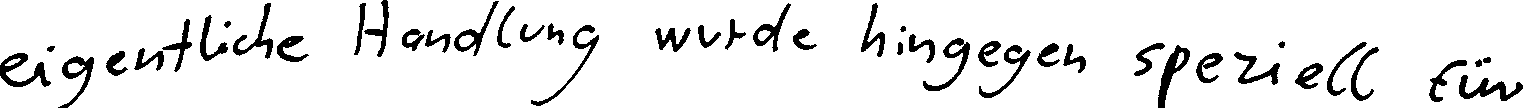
eigentliche Handlung wurde hingegen speziell für
